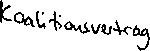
Koalitionsvertrag
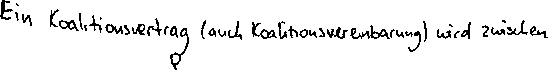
Ein Koalitionsvertrag (auch Koalitionsvereinbarung) wird zwischen
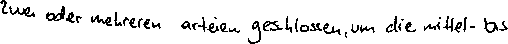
zwei oder mehreren Parteien geschlossen, um die mittel- bis
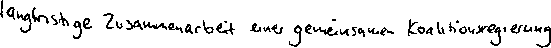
langfristige Zusammenarbeit einer gemeinsamen Koalitionsregierung
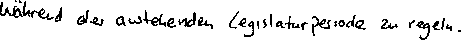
während der anstehenden Legislaturperiode zu regeln.
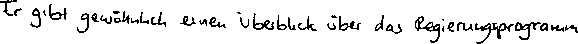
Er gibt gewöhnlich einen Überblick über das Regierungsprogramm
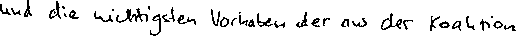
und die wichtigsten Vorhaben der aus der Koalition
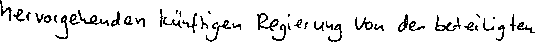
hervorgehenden künftigen Regierung. Von den beteiligten
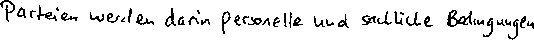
Parteien werden darin personelle und sachliche Bedingungen
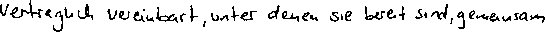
vertraglich vereinbart, unter denen sie bereit sind, gemeinsam
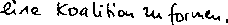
eine Koalition zu formen.
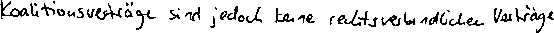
Koalitionsverträge sind jedoch keine rechtsverbindlichen Verträge
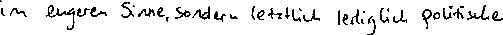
im engeren Sinne, sondern letztlich lediglich politische
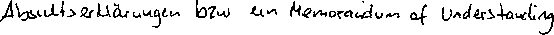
Absichtserklärungen bzw. ein Memorandum of Understanding.
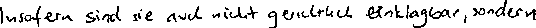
Insofern sind sie auch nicht gerichtlich einklagbar, sondern
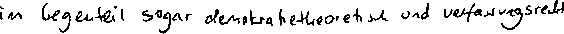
im Gegenteil sogar demokratietheoretisch und verfassungsrechtlich
